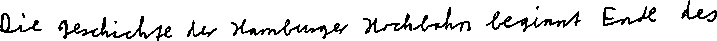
Die Geschichte der Hamburger Hochbahn beginnt Ende des
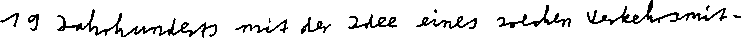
19. Jahrhunderts mit der Idee eines solchen Verkehrsmit-
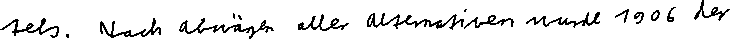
tels. Nach Abwägen aller Alternativen wurde 1906 der
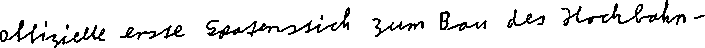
offizielle erste Spatenstich zum Bau des Hochbahn-
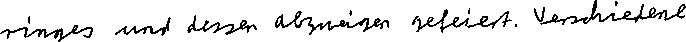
ringes und dessen Abzweigen gefeiert. Verschiedene
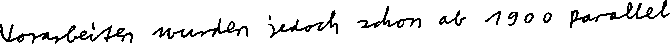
Vorarbeiten wurden jedoch schon ab 1900 parallel
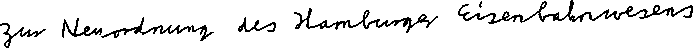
zur Neuordnung des Hamburger Eisenbahnwesens
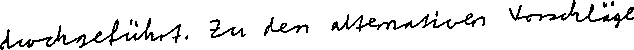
durchgeführt. Zu den alternativen Vorschläge
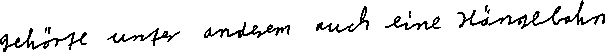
gehörte unter anderem auch eine Hängebahn
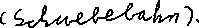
(Schwebebahn).
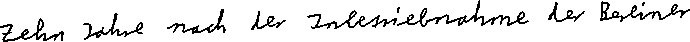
Zehn Jahre nach der Inbetriebnahme der Berliner
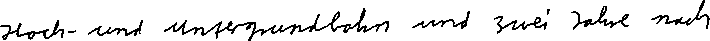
Hoch- und Untergrundbahn und zwei Jahre nach
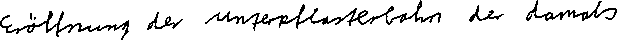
Eröffnung der Unterpflasterbahn der damals
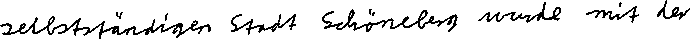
selbstständigen Stadt Schöneberg wurde mit der
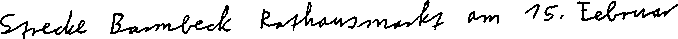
Strecke Barmbek Rathausmarkt am 15. Februar
